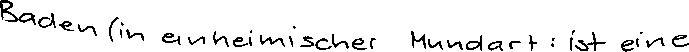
Baden (in einheimischer Mundart: ist eine
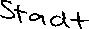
Stadt
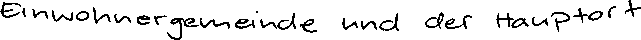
Einwohnergemeinde und der Hauptort
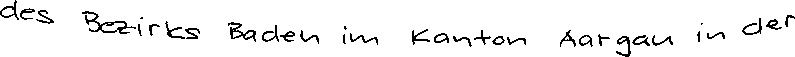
des Bezirks Baden im Kanton Aargau in der
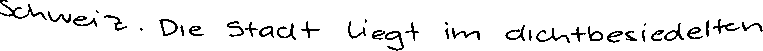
Schweiz. Die Stadt liegt im dichtbesiedelten
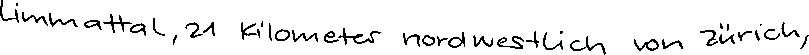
Limmattal, 21 Kilometer nordwestlich von Zürich,
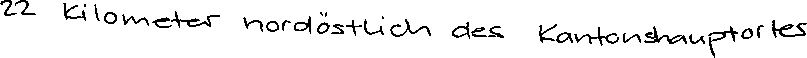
22 Kilometer nordöstlich des Kantonshauptortes
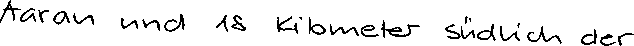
Aarau und 18 Kilometer südlich der
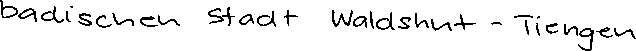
badischen Stadt Waldshut-Tiengen
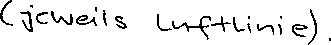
(jeweils Luftlinie).
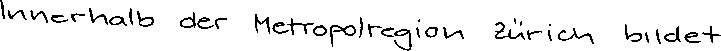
Innerhalb der Metropolregion Zürich bildet
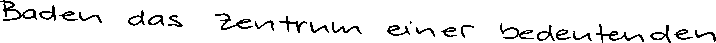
Baden das Zentrum einer bedeutenden
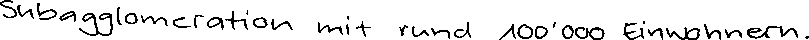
Subagglomeration mit rund 100’000 Einwohnern.
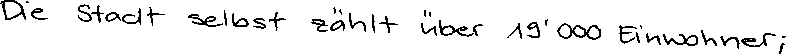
Die Stadt selbst zählt über 19’000 Einwohner;
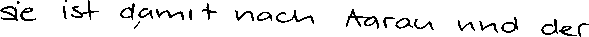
sie ist damit nach Aarau und der
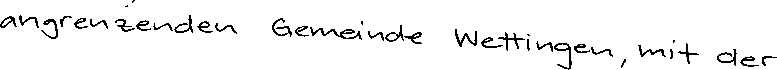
angrenzenden Gemeinde Wettingen, mit der
